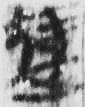連
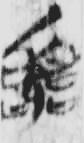囂
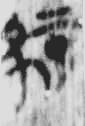○（冢）
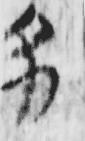豕
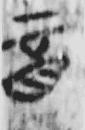酉（酒）
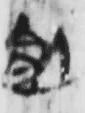○（食）
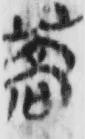蒿
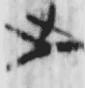之
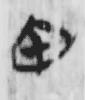甶（思）
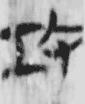攻
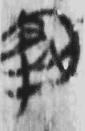解
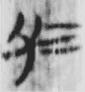於
